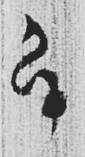弓
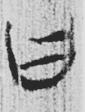曰
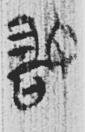敢
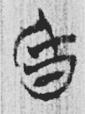昏（問）
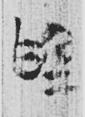爲
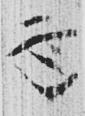正（政）
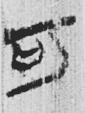可（何）
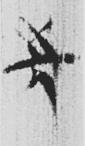先
